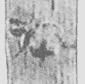{九十}
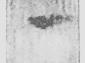一
